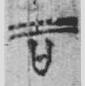吉
